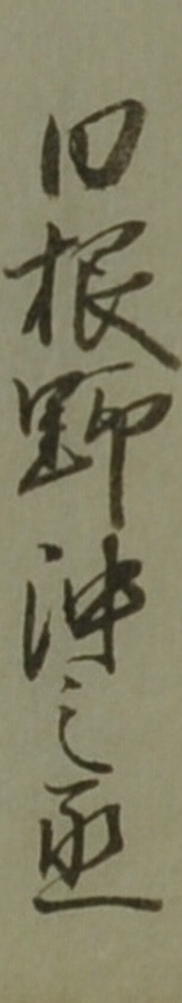日根野沖之丞
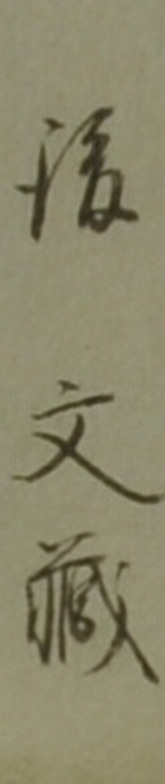後文蔵
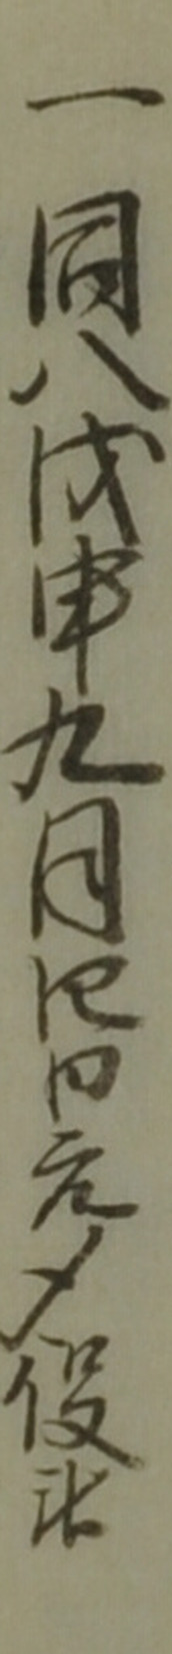一同八戊申九月四日元〆役被
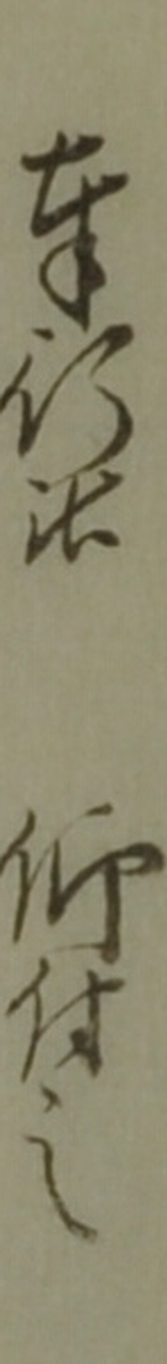奉行被仰付之
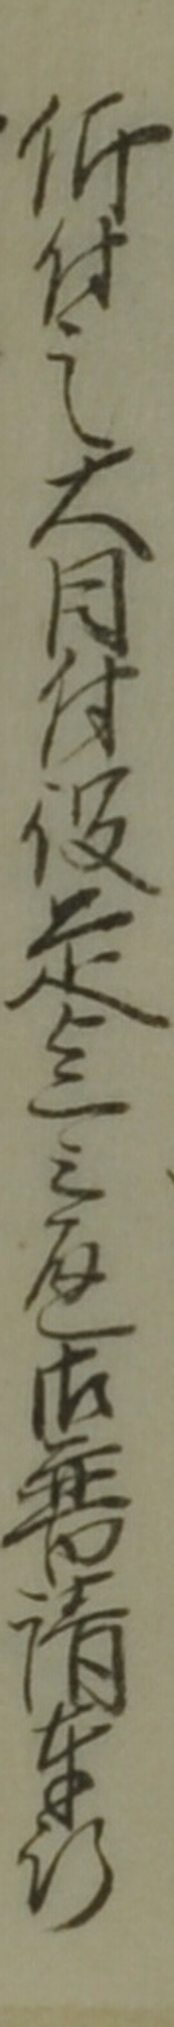仰付之大目付役是迄之通御普請奉行
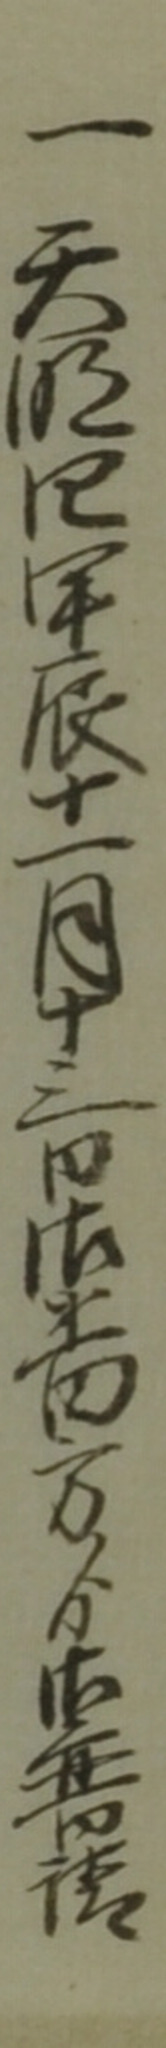一天明四甲辰十一月十三日御番方ゟ御普請
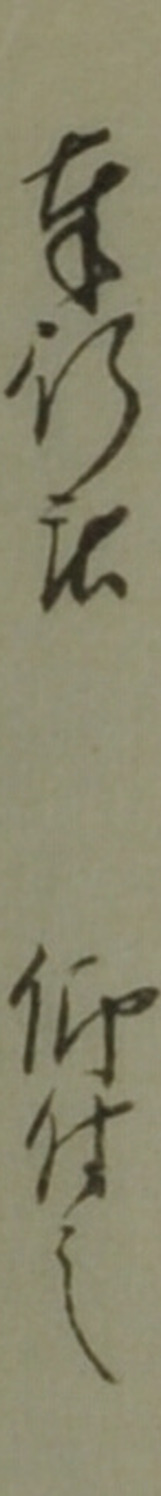奉行被仰付之
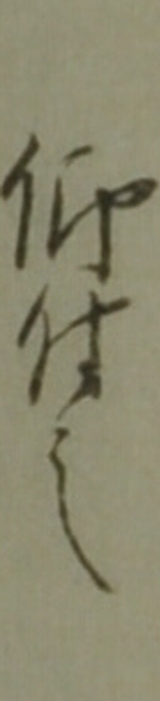仰付之
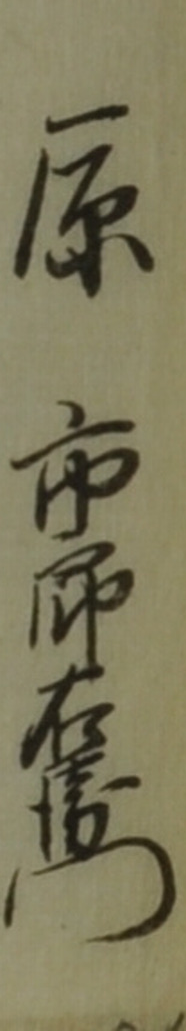原市郎右衛門
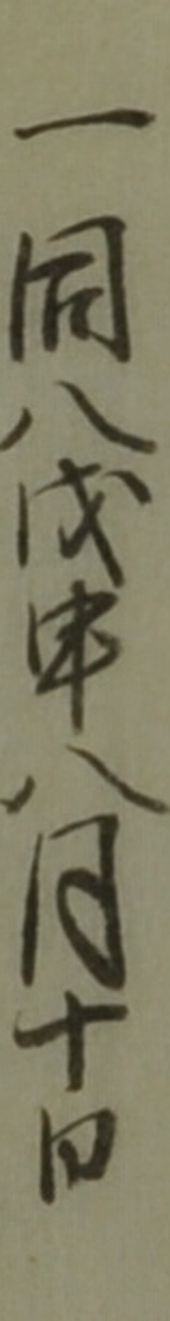一同八戊申八月十日
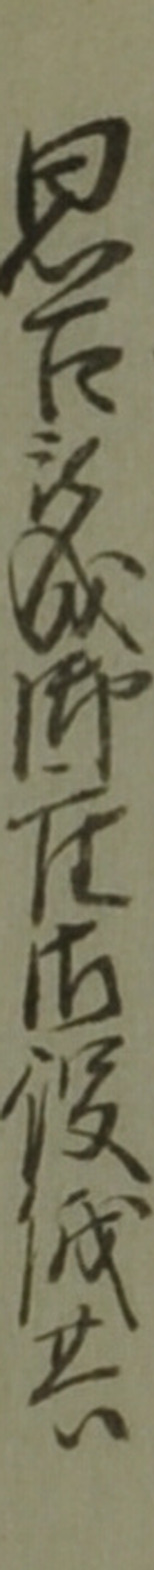思召被成御座御役儀共
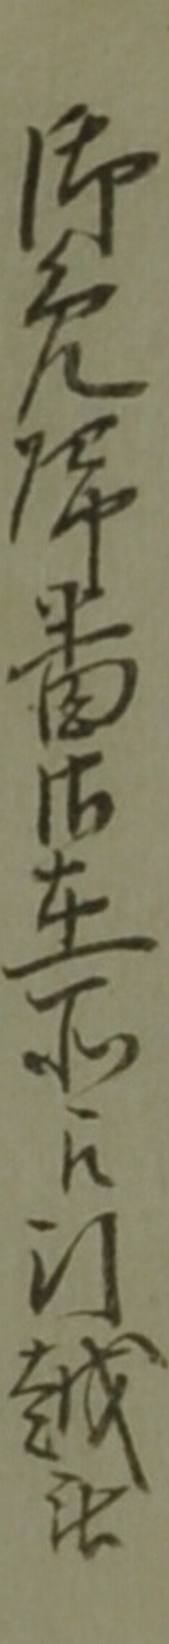御免帰番御在所江引越被
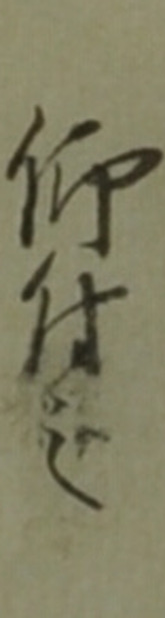仰付之
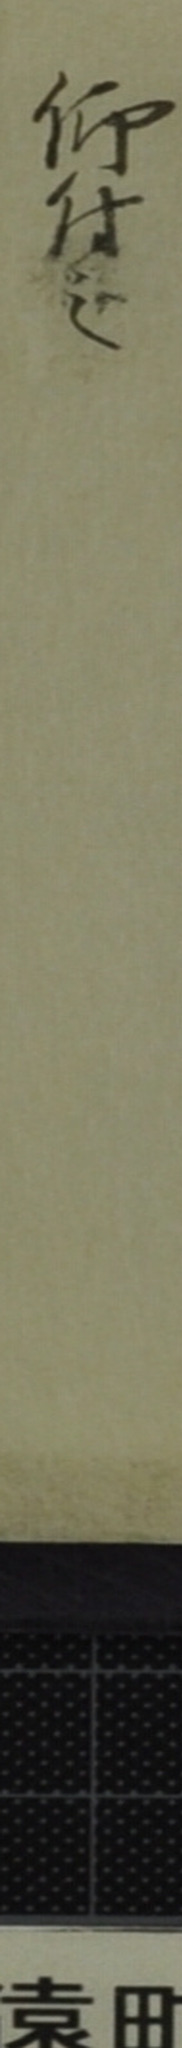仰付之
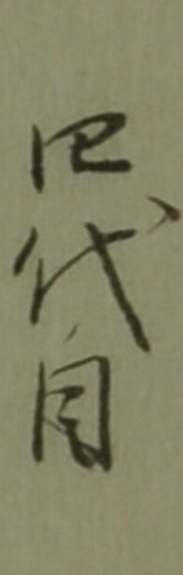四代目
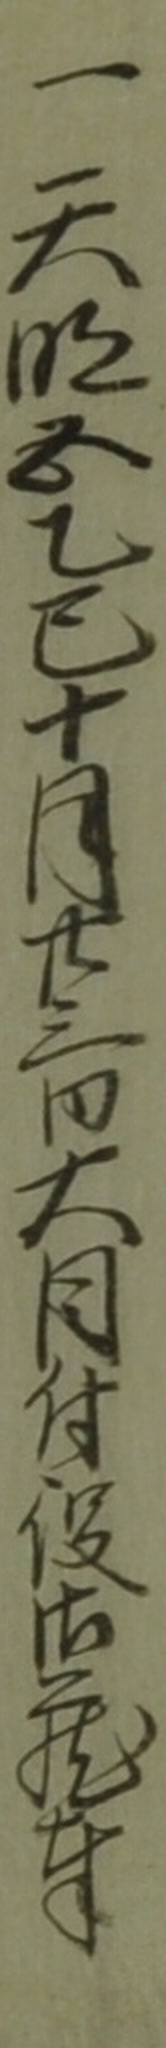一天明五乙巳十月廿三日大目付役御蔵奉
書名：諸御役代々録（六）
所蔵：伊那市立高遠町図書館・合同会社AMANE
